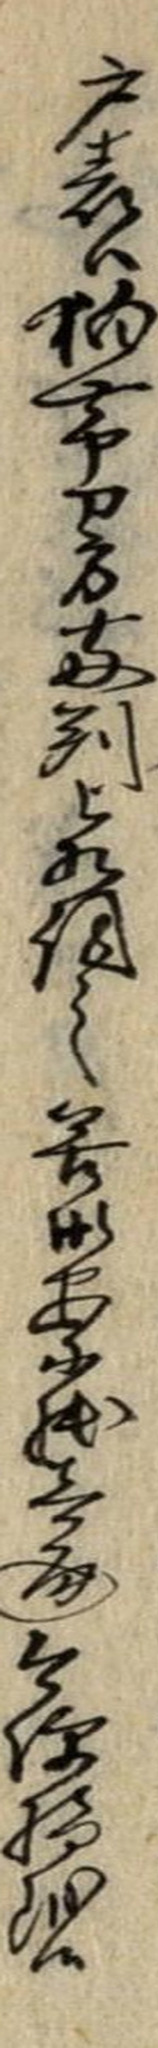戸表は狛帯刀方両判被相調之筈御案紙壱通今便指越候
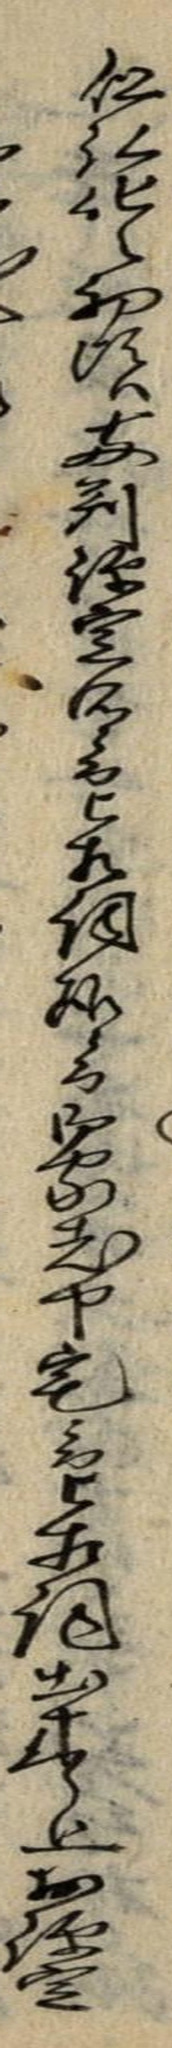但弘化之初頃は両判評定所にて被相調趣にて御家老中宅にて被相調出来之上於評定
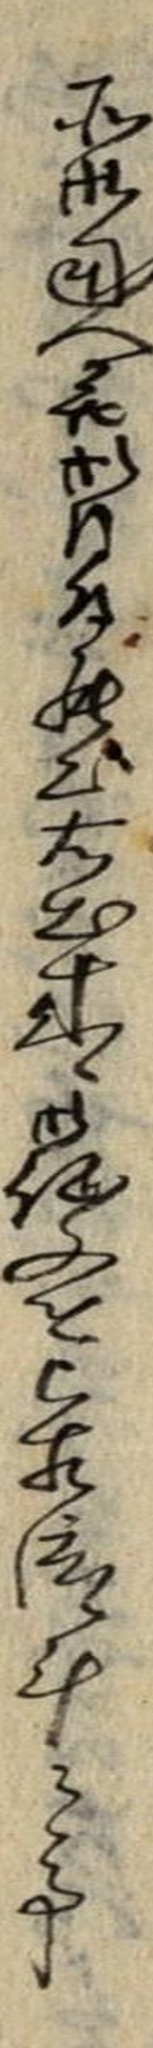所御用人并御目付罷出右出来候御証文を被相渡候斗に候事
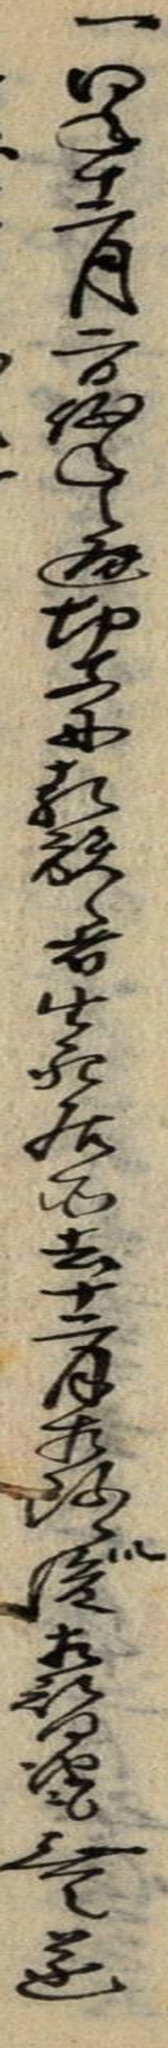一同年十二月二日例年之通切支丹類族之者生死居所去十二月相改候以後相替儀も無之遂
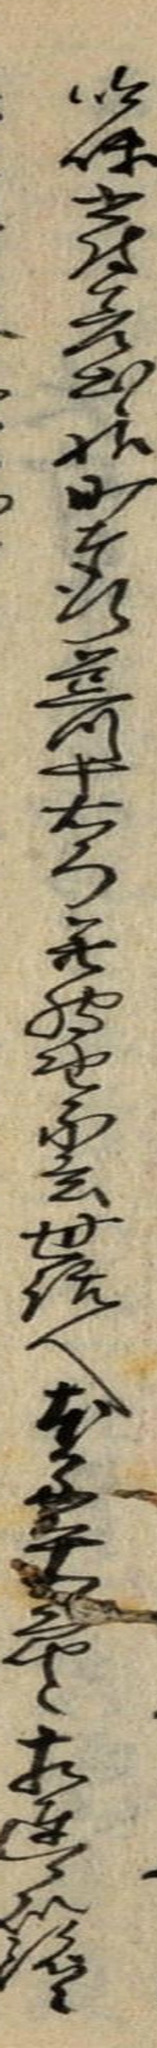吟味書付差出候様町奉行荒川十右衛門并狩野永玄世話人本多平五郎へ相達候処銘々
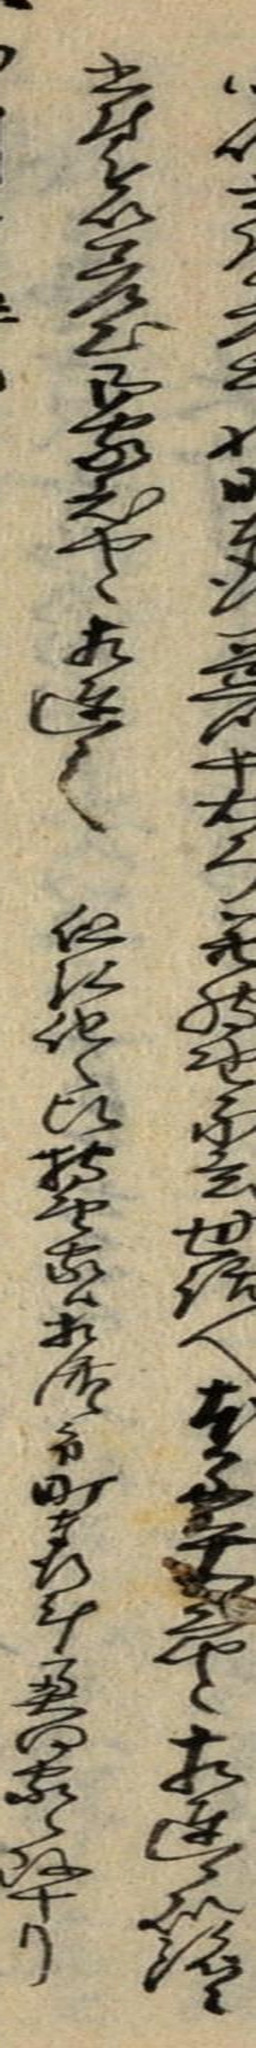書付を以差出御家老中へ相達之但弘化之頃狩野家は相済候に付町奉行斗奥田家へ改ナリ
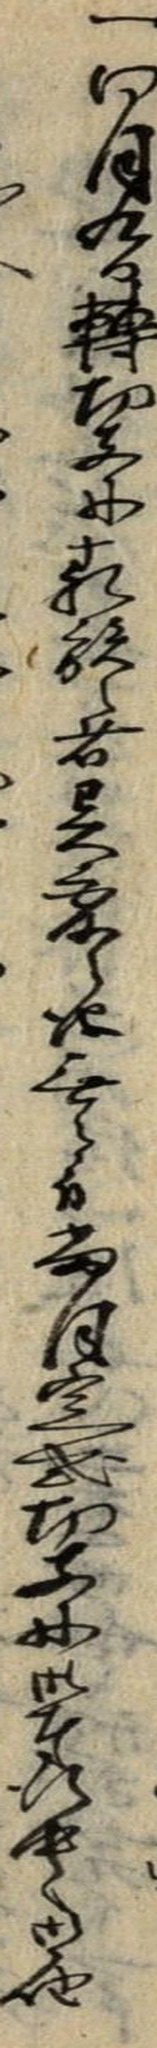一同月九日転切支丹類族之者異変之儀無之に付当月定式切支丹御奉行中へ御届
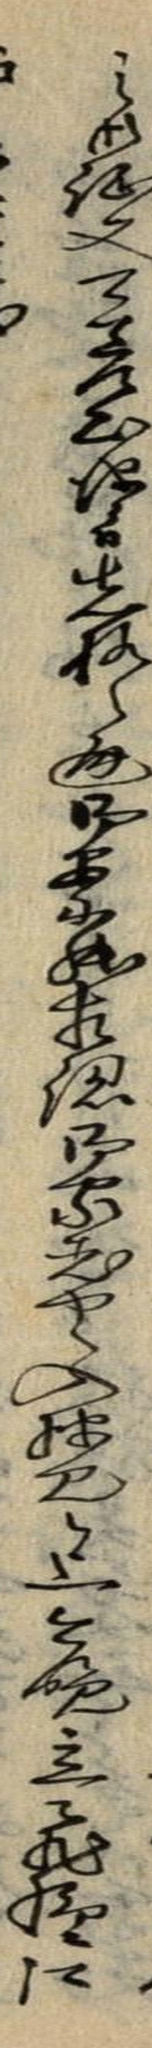之御証文可差出儀に付先格之通御案紙相認御家老中へ入披見候上今晩立飛脚に江
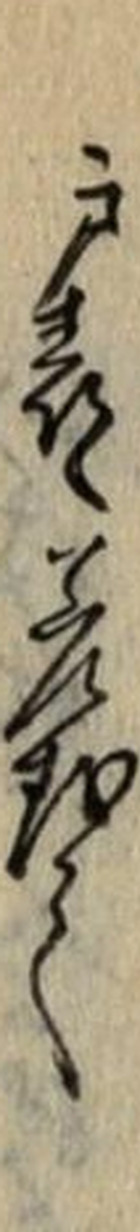戸表へ差越之
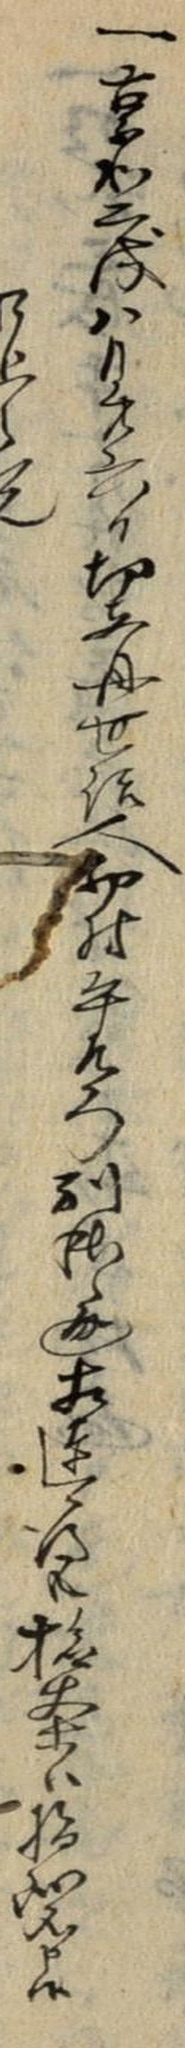一享和二戌八月廿六日切支丹世話人西村平左衛門別紙之通相達候得共検使等は指越不申候
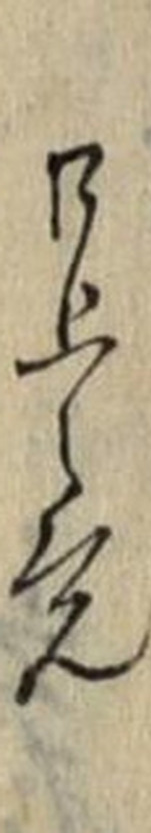口上之覚
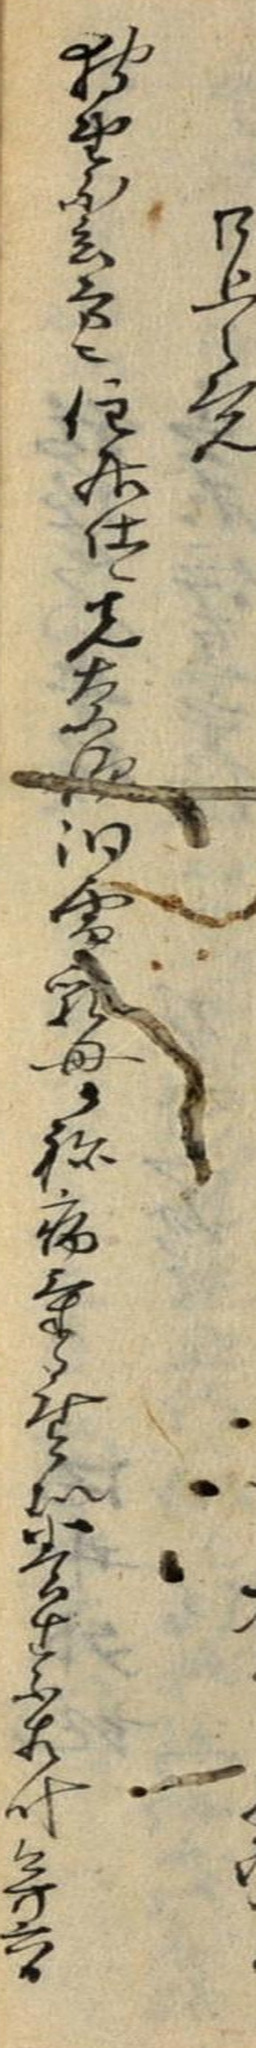狩野永玄方に住居仕候先奈須洞雪乳母かね病気御座候処養生不相叶今廿六日
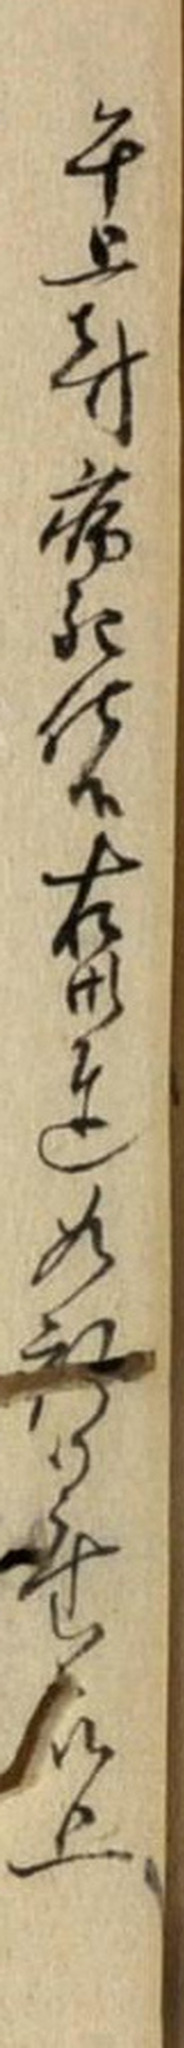午上刻病死仕候右御達如斯御座候以上
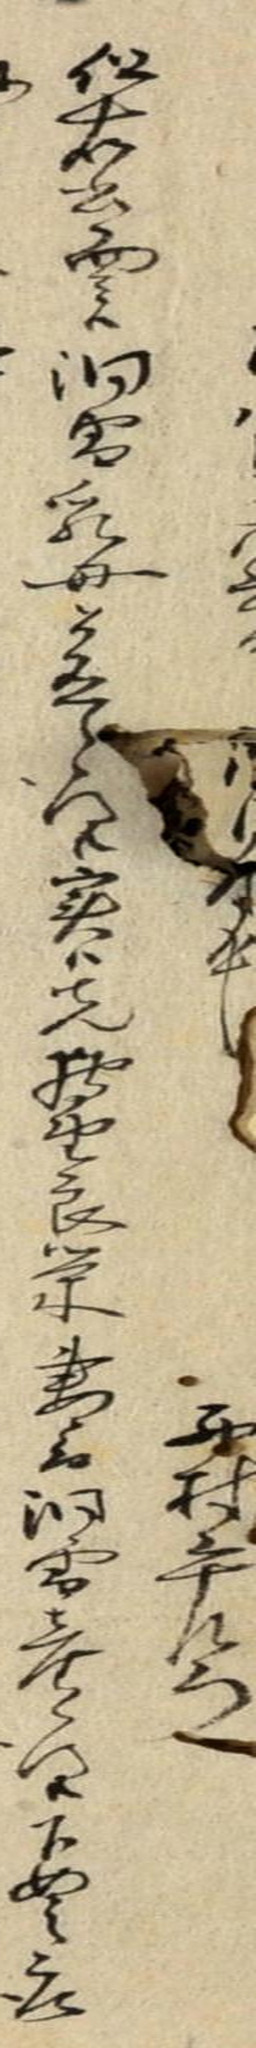但右書面には洞雪乳母と有之候得共実は先狩野良栄妻にて洞雪産候得共下女之取
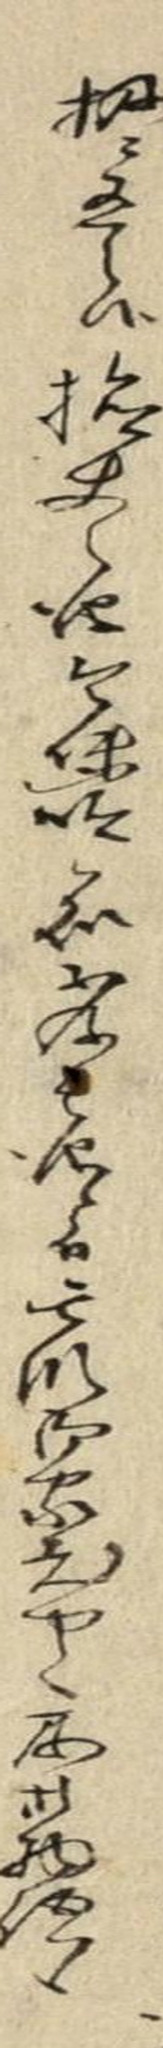扱に有之候検使之儀令吟味候処不及其儀候に付其段御家老中へ及御物語候
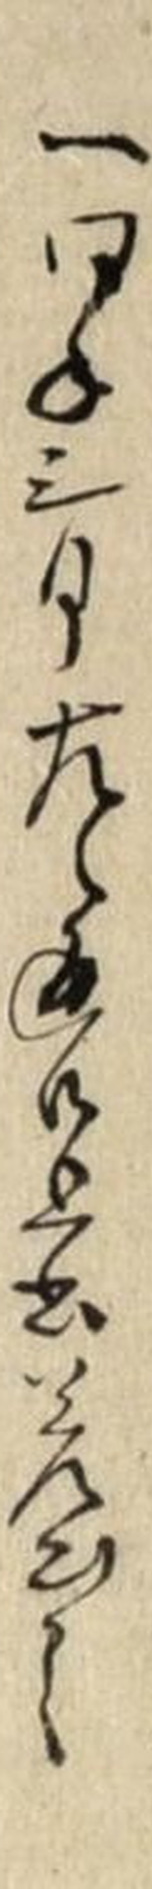一同年三月左之通口上書差出之
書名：御停止異変死失
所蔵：福井県文書館 Fukui Prefectural Archives
